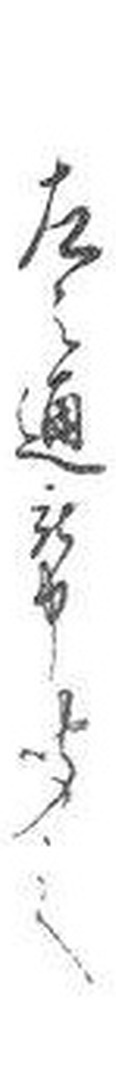左之通被申聞之
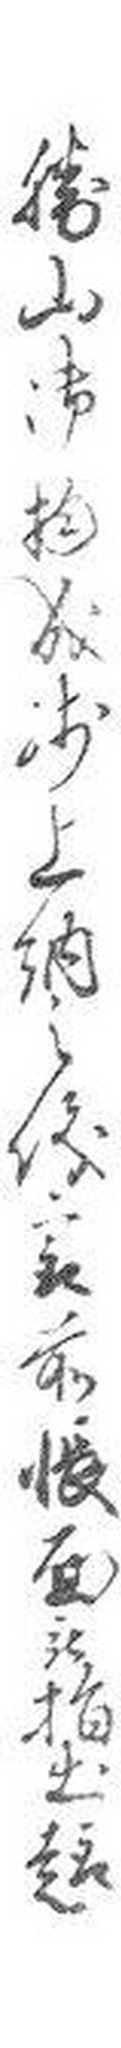勝山御物成銭上納之儀最前帳面被指出趣
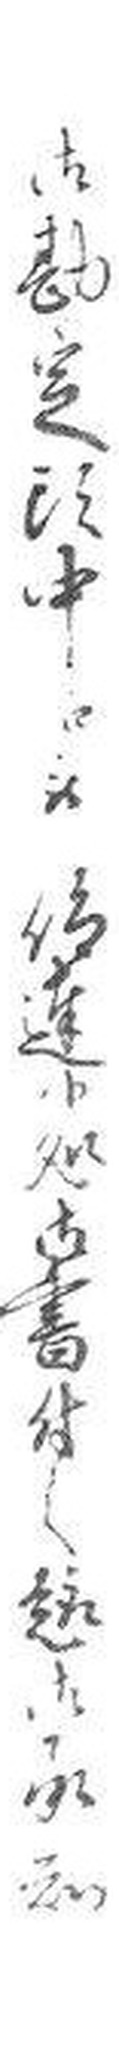御勘定頭中江被仰達候処御書付之趣御承知
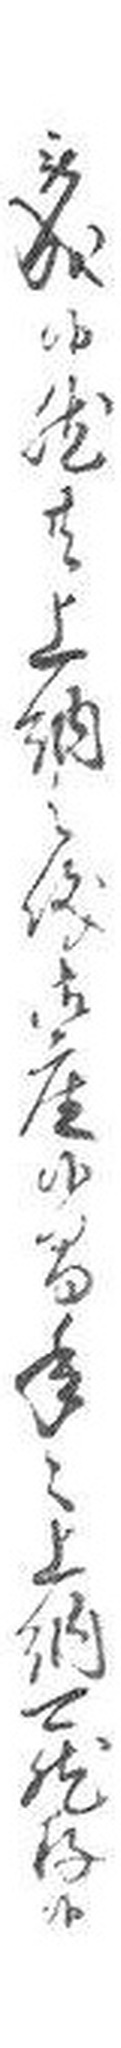被成候然共上納之儀御座候間年々上納可然存候
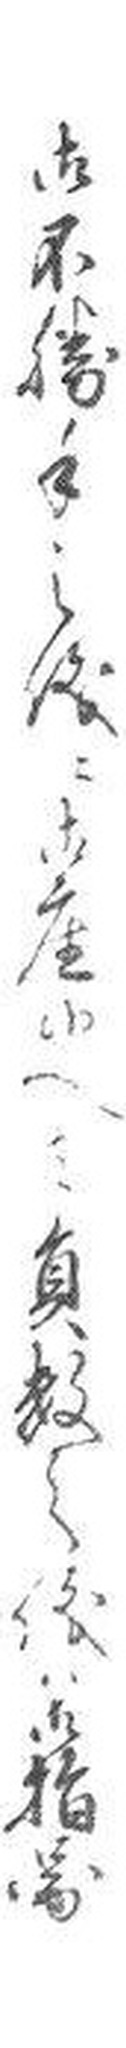御不勝手之儀ニ御座候へ者員数之儀ハ御指図
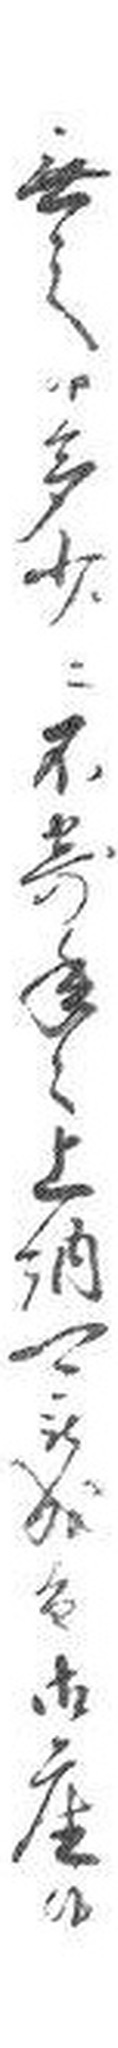無之候多少ニ不寄年々上納可被成旨御座候
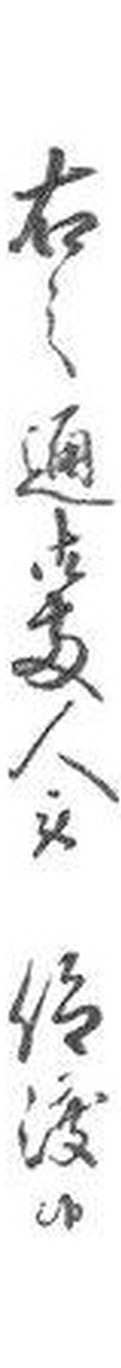右之通御両人被仰渡候
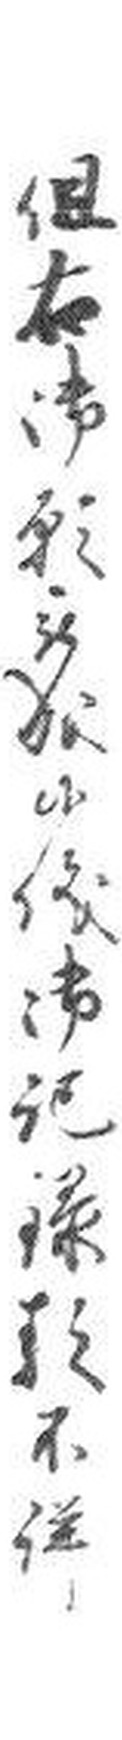但右御願被成候儀御記録類不詳
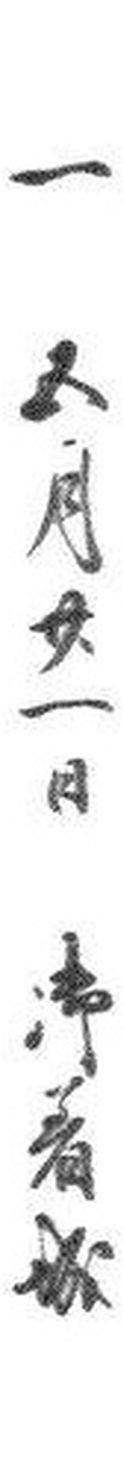一五月廿一日御着城
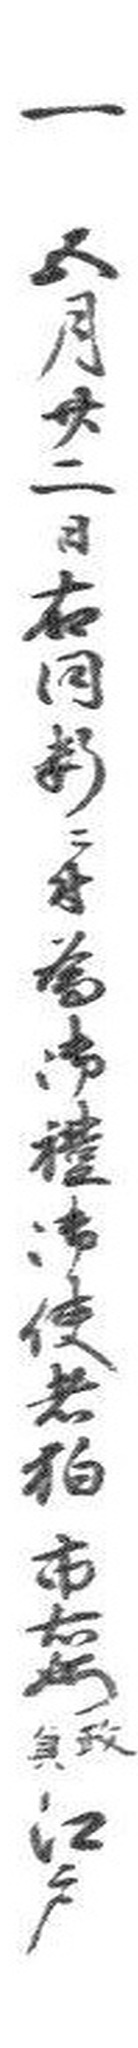一五月廿二日右同断ニ付為御礼御使者狛市右衛門政貞江戸
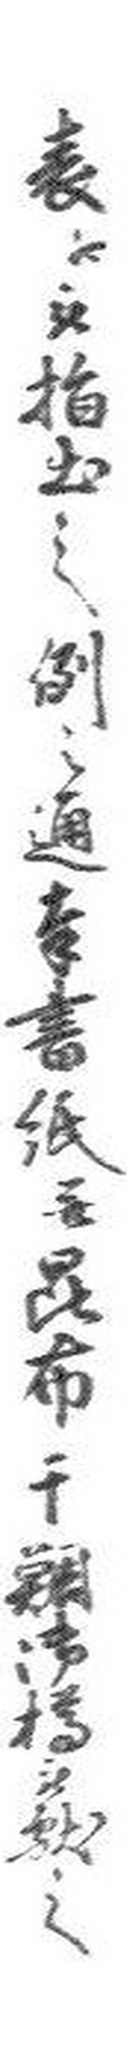表江被指出之例之通奉書紙并昆布干鯛御樽被献之
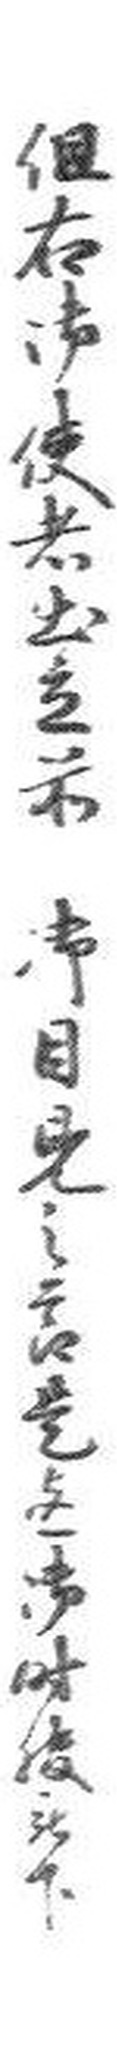但右御使者出立前御目見之節是迄御時服被下
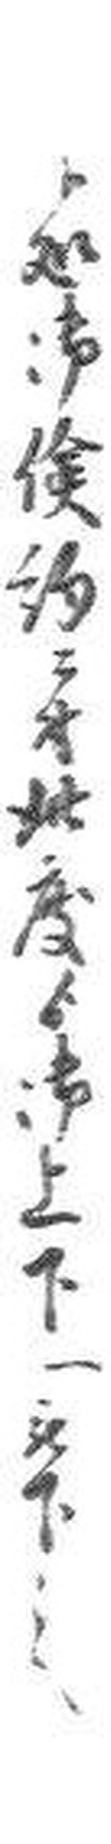候処御倹約ニ付此度ゟ御上下一被下之
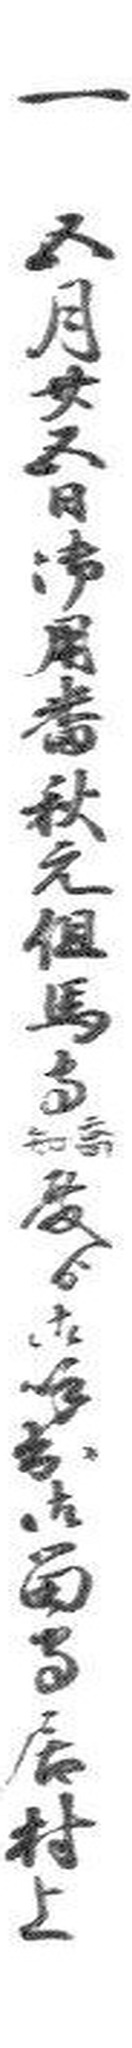一五月廿五日御用番秋元但馬守喬知殿ゟ御呼出御留守居村上
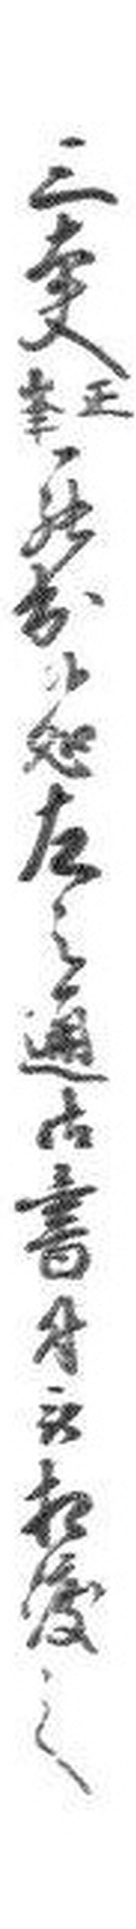三太夫正峯罷出候処左之通御書付被相渡之
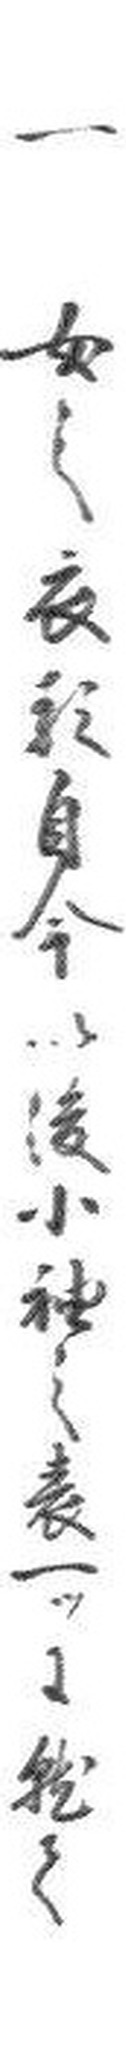一女之衣類自今以後小袖之表一ツに就て
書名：家譜 二十九 吉邦公 従正徳二年到正徳三年
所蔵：福井県文書館 Fukui Prefectural Archives
